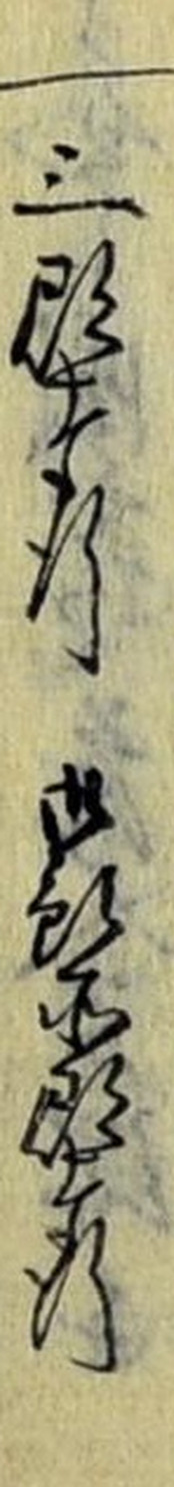三郡奉行御預所郡奉行
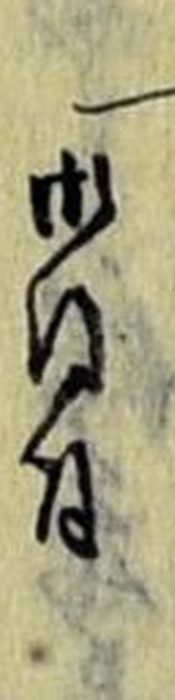御目付
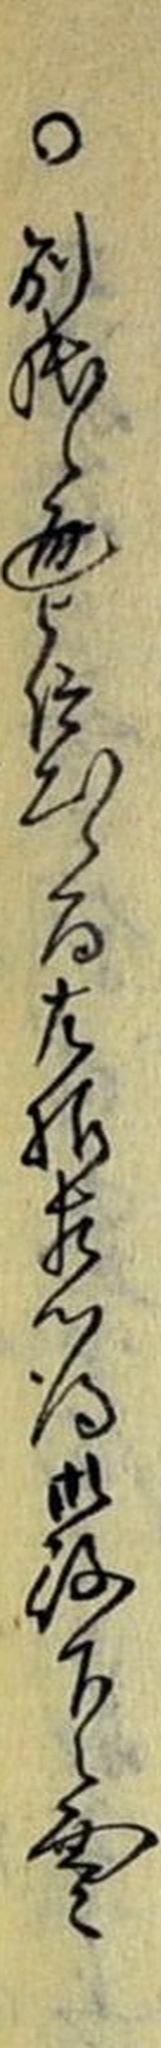〇別紙之通被仰出候間左様相心得御役下之面々
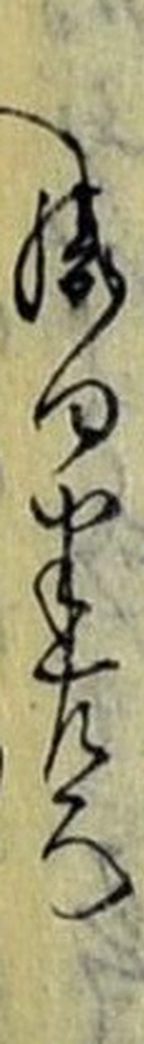織田半左衛門
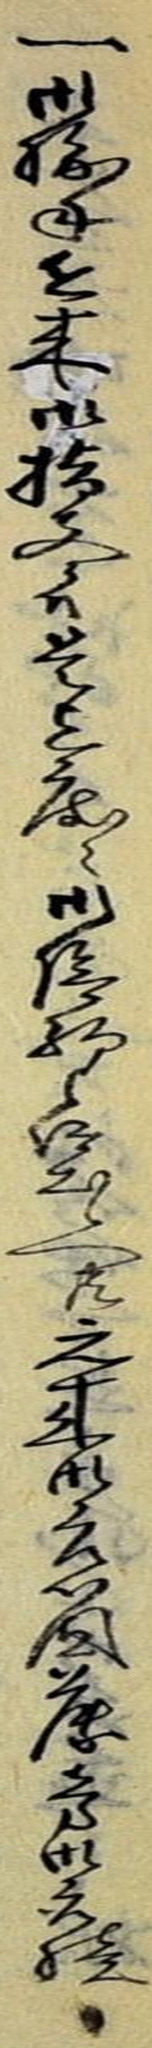一御勝手近来御指支ニ付是迄度々御倹約被仰出候へ共元来御取箇薄方御取続
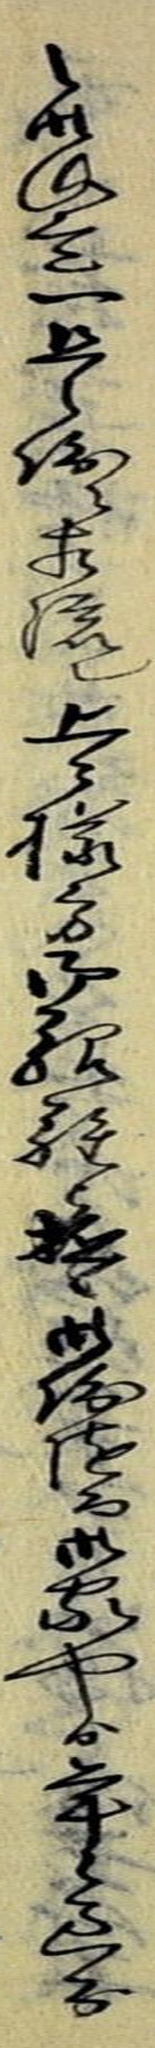之御趣意一旦之儀ニ相流レ上々様方御艱難被遊候御儀随而御家中ゟ年々過分
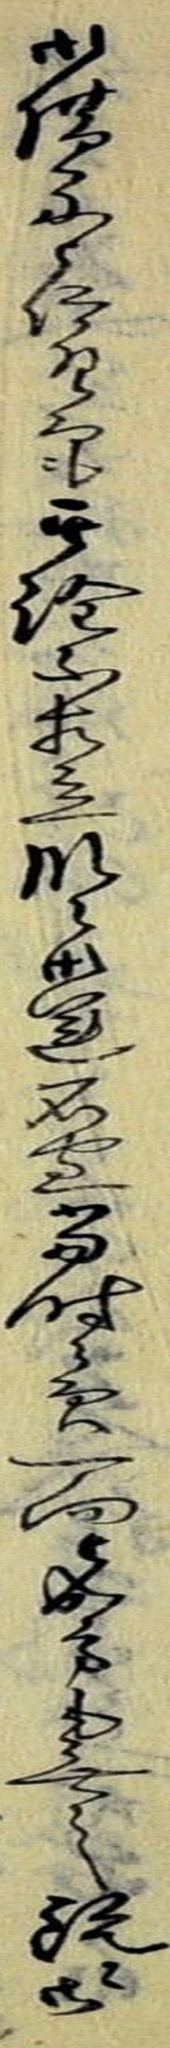御借米被仰付候而も其詮不相立段々御運不宜当時ニ而ハ一向被成方も無之既ニ御
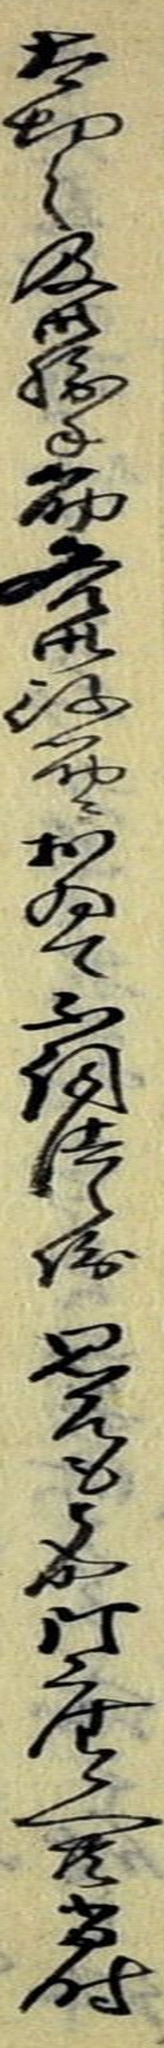太切之及御勝手筋各御役筋ニおゐて不調法之儀思召も被成御座候へ共当時
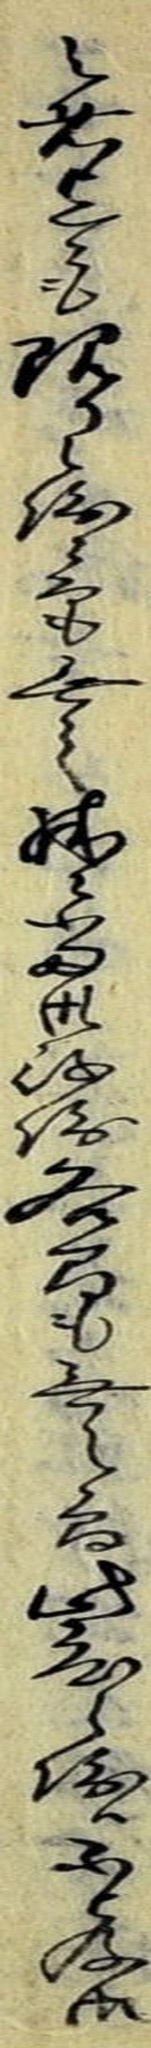之者迄ニも限り候儀ニ而も無之殊ニ当御役儀各間も無之候間此度之儀ハ不被及御
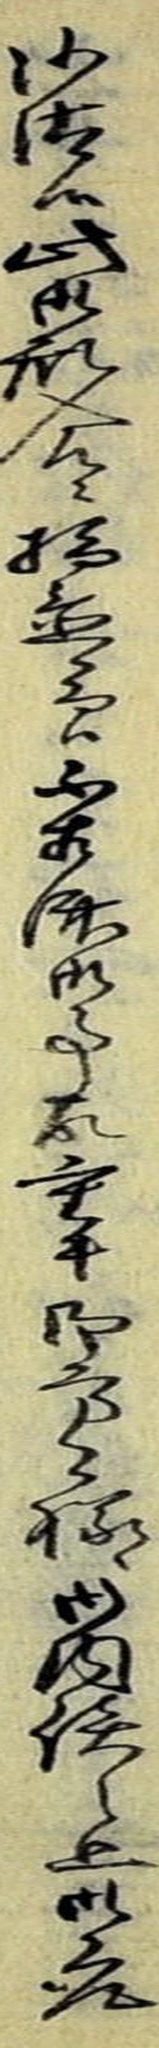沙汰候此御形合ニ指置候而ハ不相済御事故重キ御方々様へ御内談之上御取
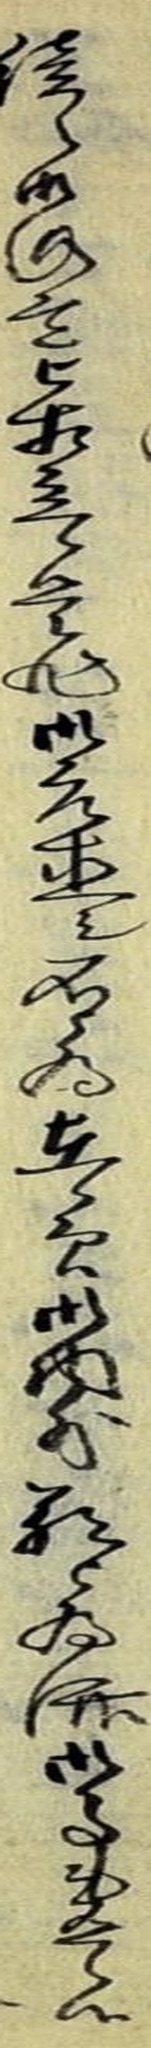続之御趣意被相立候是非御取直シ不被為在候而ハ御内外難被為済御事も有之候
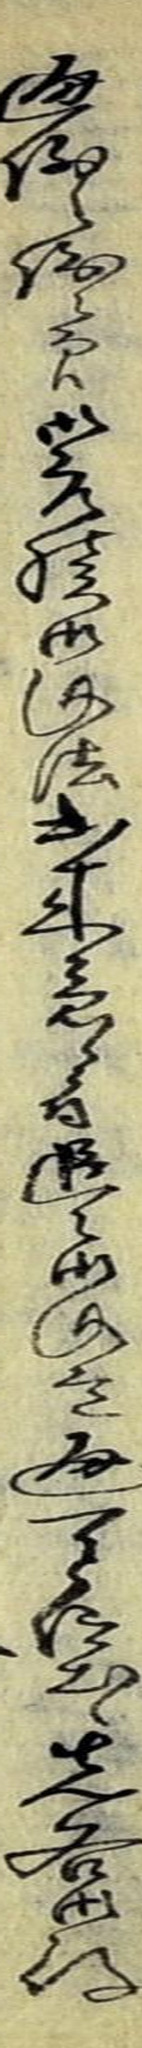通例之儀ニ而ハ御取続御趣法出来兼候ニ付追々御趣意通可被仰出候先各御役
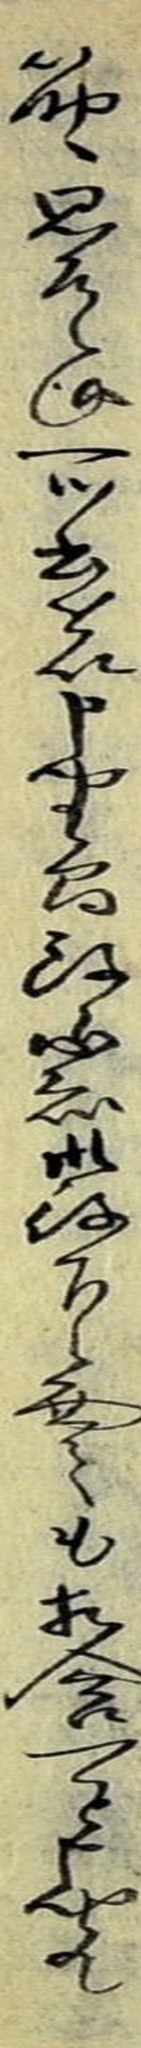筋へ思召之趣一ツ書を以申聞候間致承知御役下之面々へも相含可被申聞候
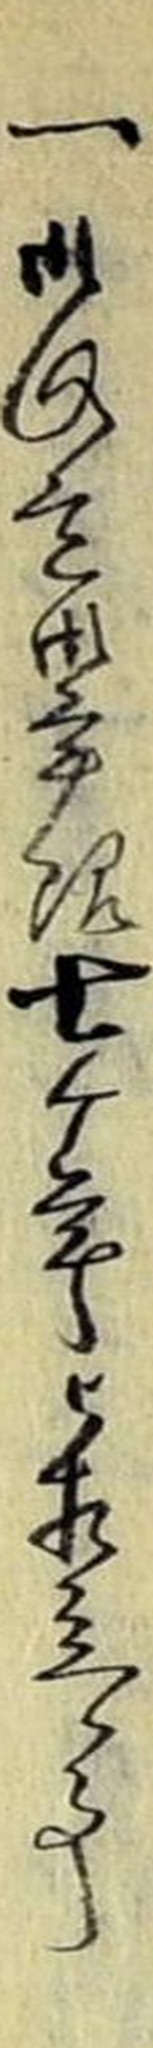一御趣意御年限七ケ年被相立候事
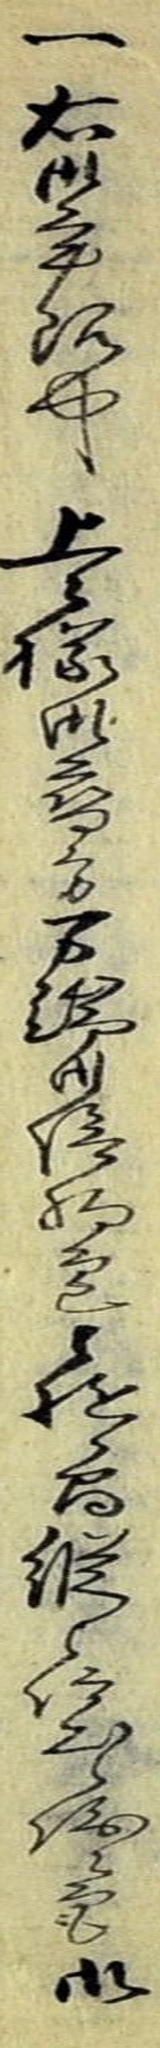一右御年限中上々様御暮方万端御倹約而已被遊候間縦被仰出候儀ニ而も御
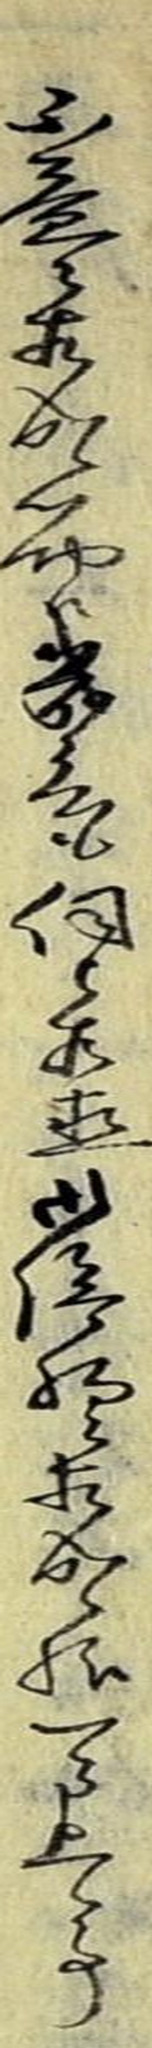不益ニ相成候筋ハ幾度も伺被相直御倹約ニ相成候様可申上候事
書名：命令之部 三
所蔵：福井県文書館 Fukui Prefectural Archives
